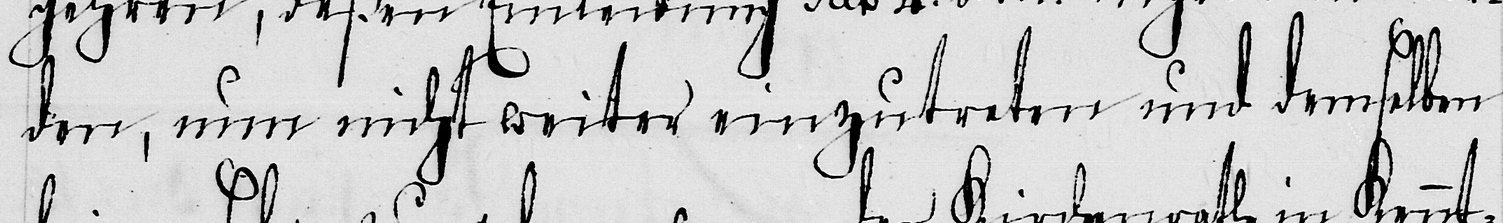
den, nun nicht weiter einzutreten und demselben
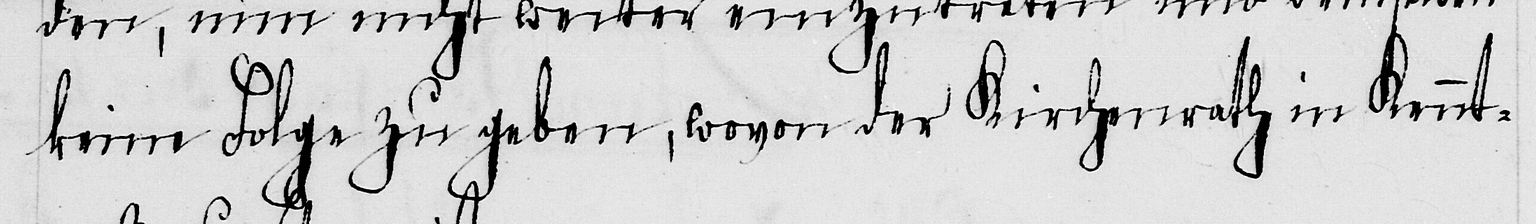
keine Folge zu geben, wovon der Kirchenrath in Kennt¬
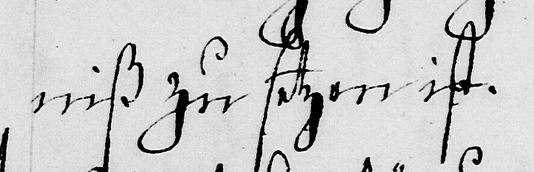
niß zu setzen ist.
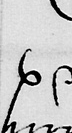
le,
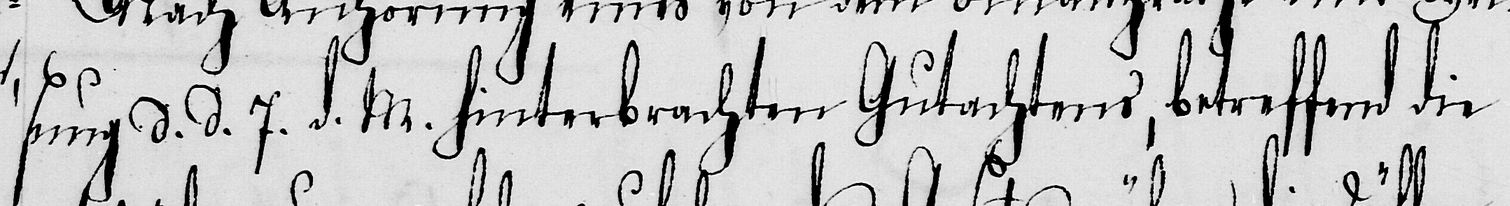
ung d. d. 7. d. M. hinterbrachten Gutachtens, betreffend die
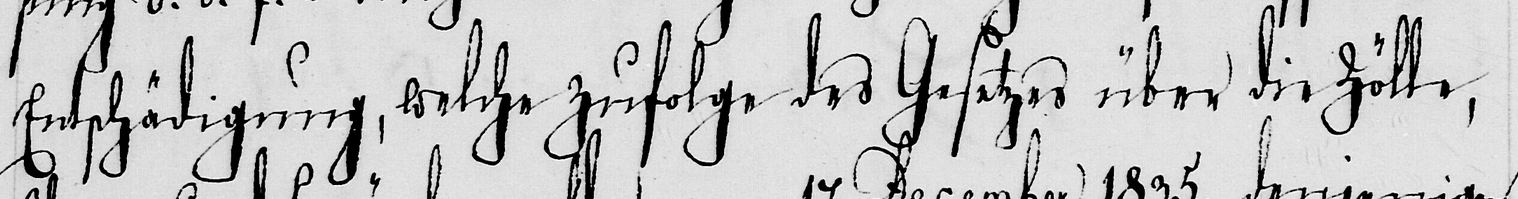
ntschädigung, welche zufolge des Gesetzes über die Zöl¬
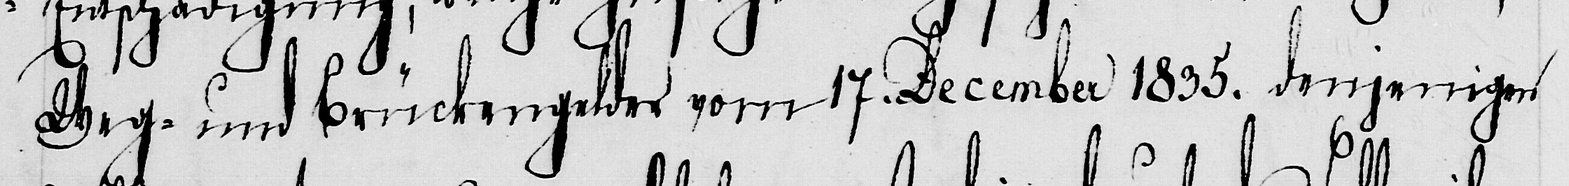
Weg- und Brückengelder vom 17. December 1835. denjenigen
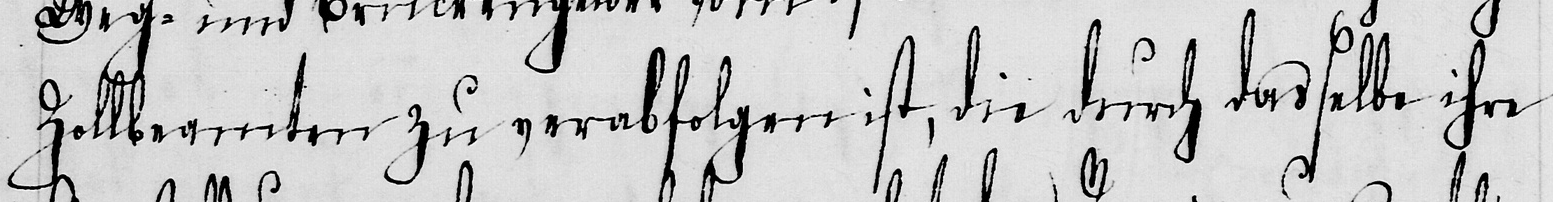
Zollbeamten zu verabfolgen ist, die durch dasselbe ihre
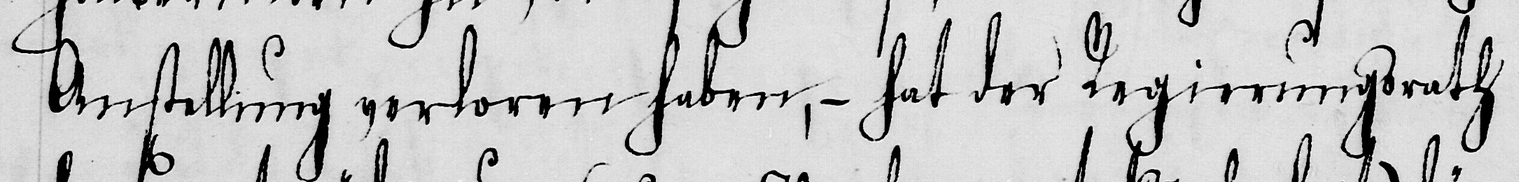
Anstellung verloren haben, – hat der Regierungsrath
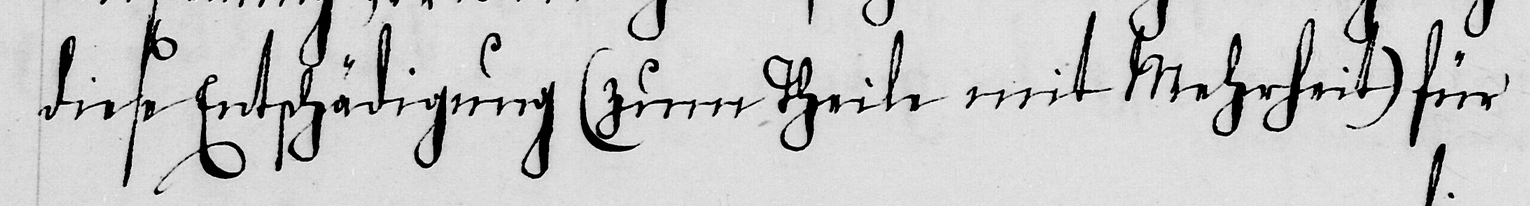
diese Entschädigung (zum Theil mit Mehrheit) für
